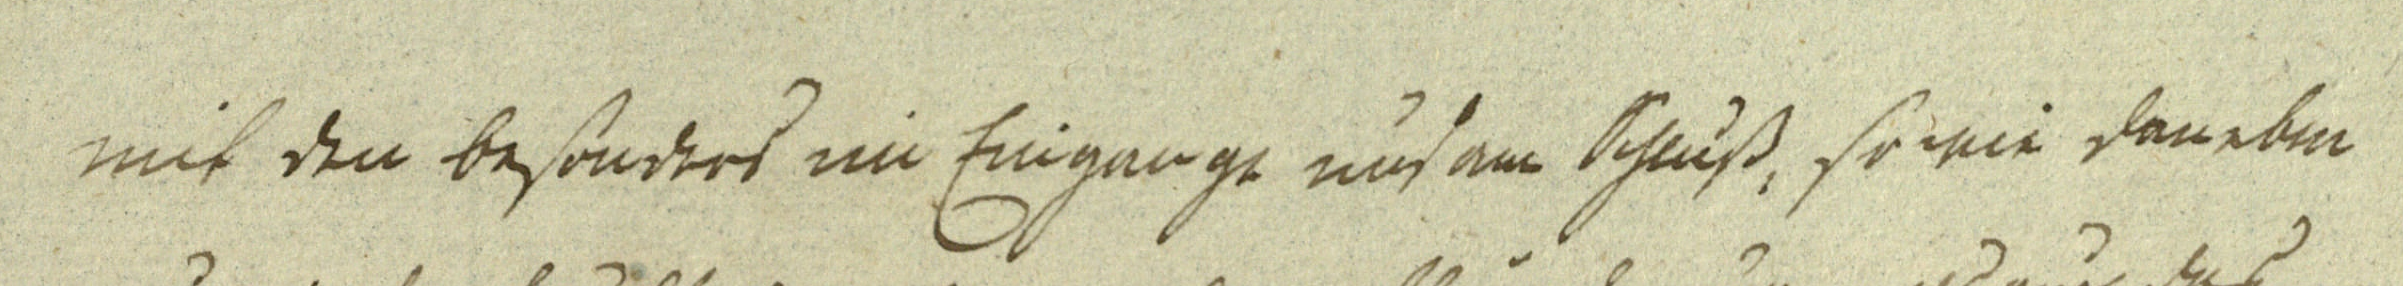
mit den besonders im Eingange und am Schluß, so wie daneben
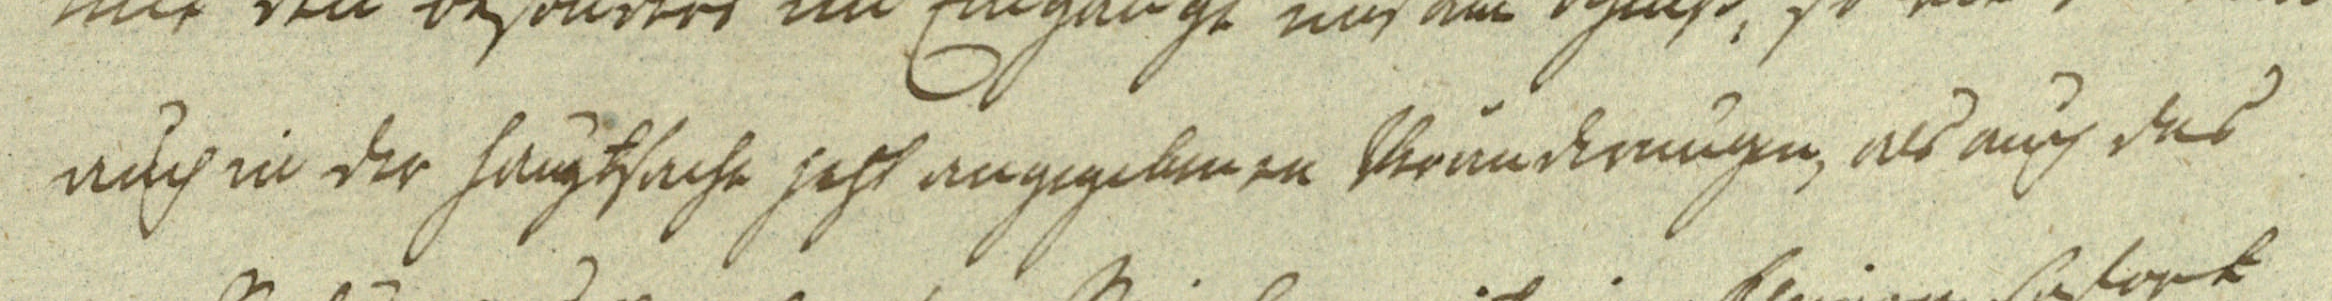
auch in der Hauptsache jetzt angegebenen Veränderungen, als auch das
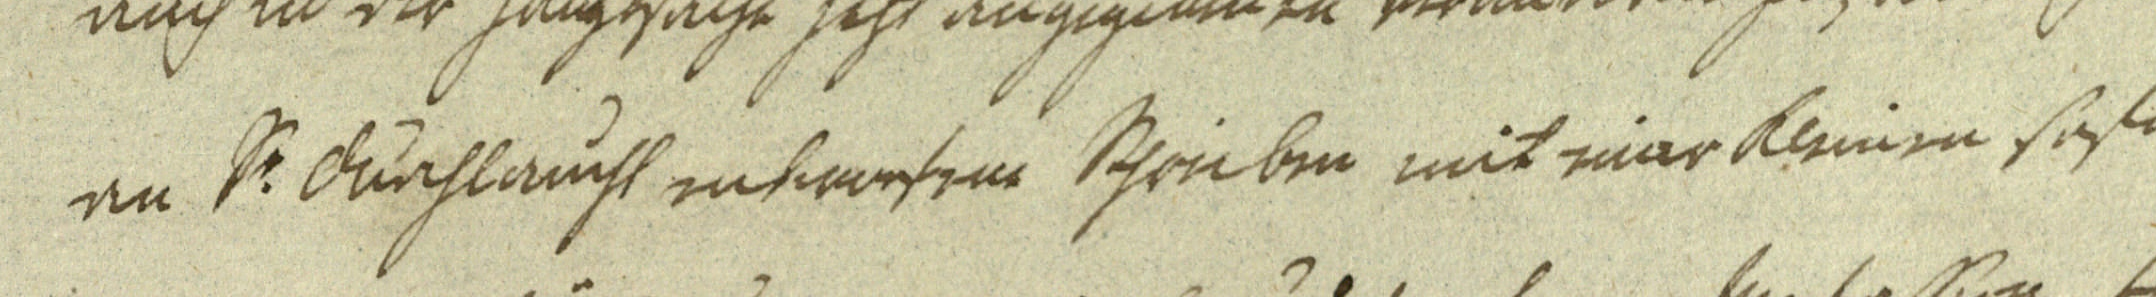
an Sr. Durchlaucht entworfene Schreiben mit einer kleinen sofort
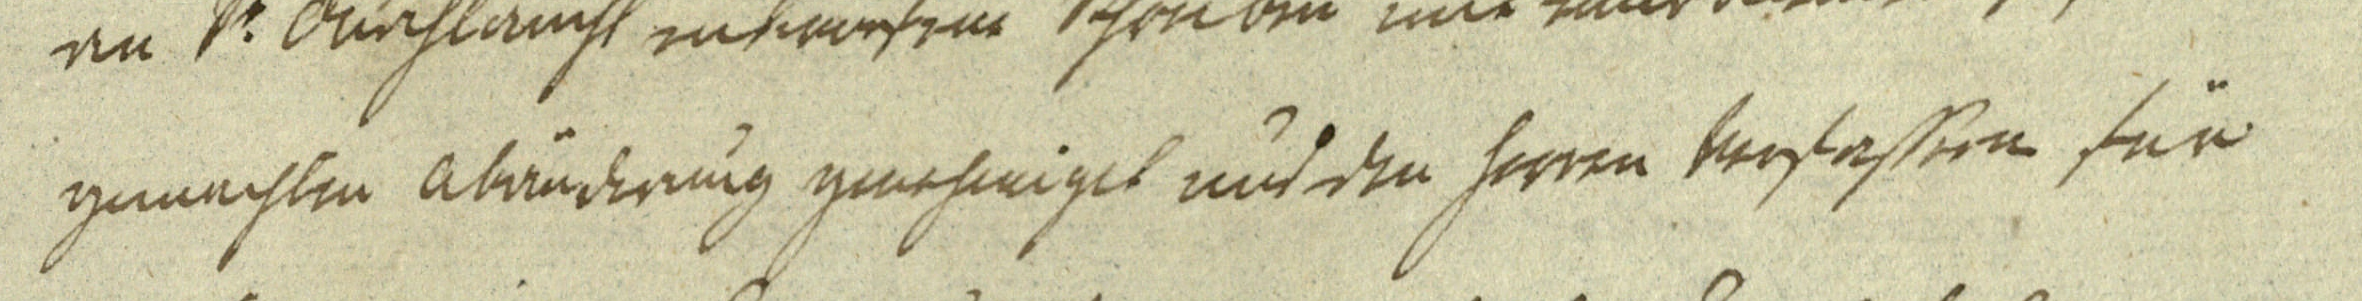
gemachten Abänderung genehmiget und den Herren Verfassern für
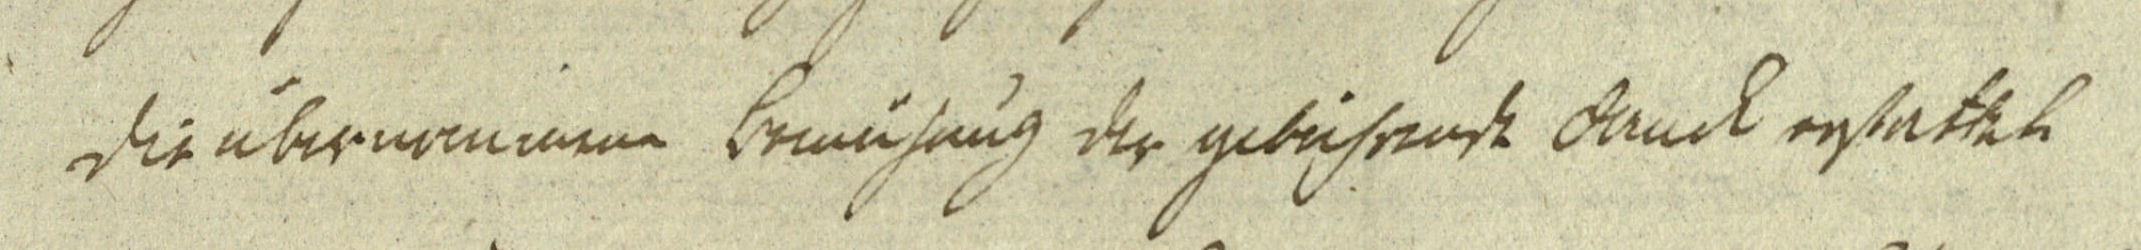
die übernommene Bemühung der gebührende Dank erstattet.
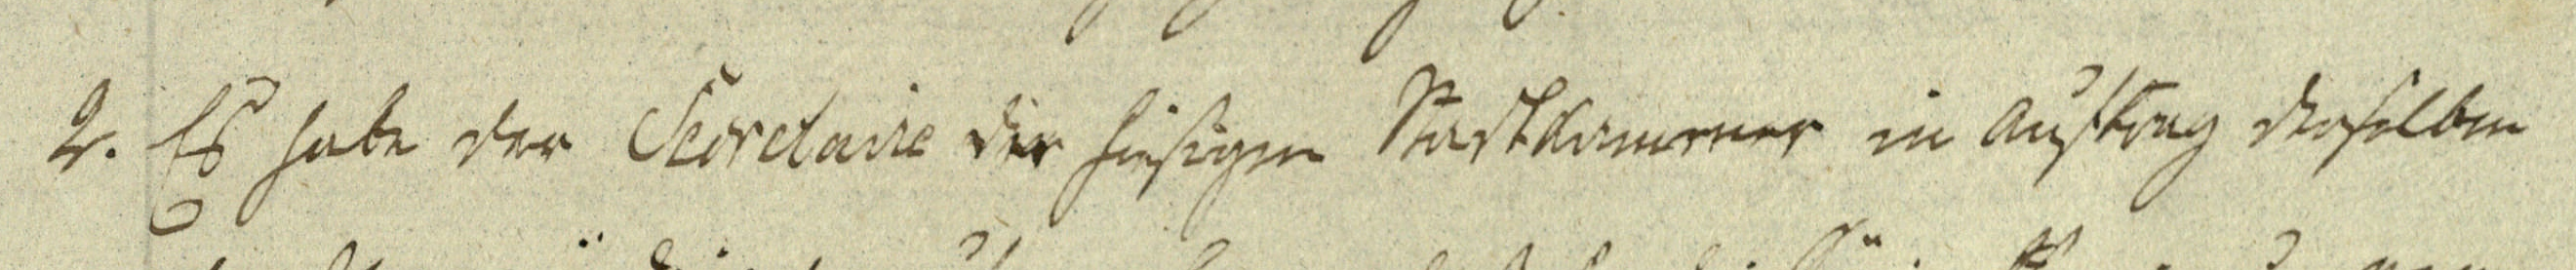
2. Es habe der Secretaire der hiesigen Stadtkammer in Auftrag derselben
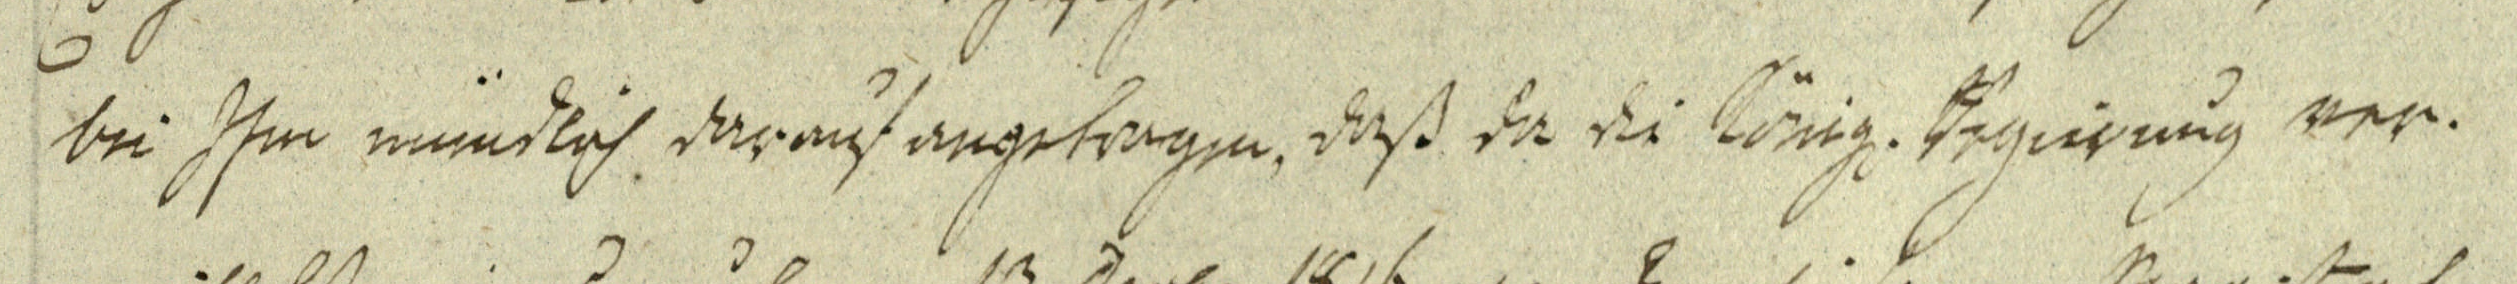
bei Ihm mündlich darauf angetragen, daß da die Königl. Regierung ver¬
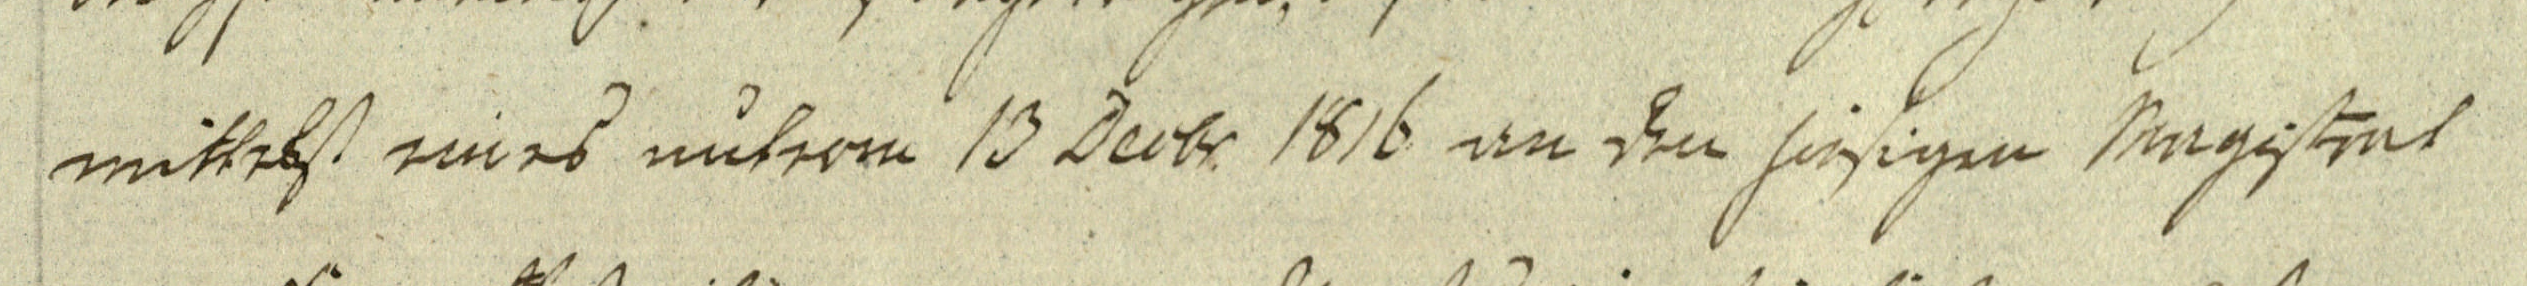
mittelst eines unterm 13 Decbr. 1816 an den hiesigen Magistrat
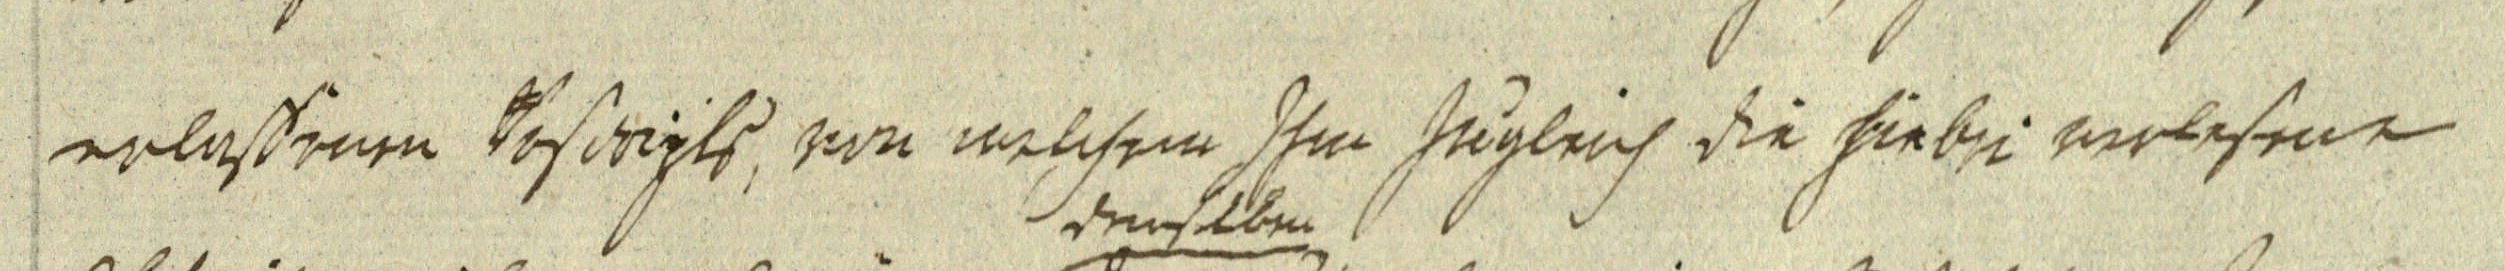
erlassenen Rescripts, von welchem Ihm zugleich die hiebei verlesene
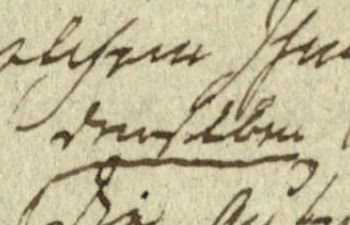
demselben
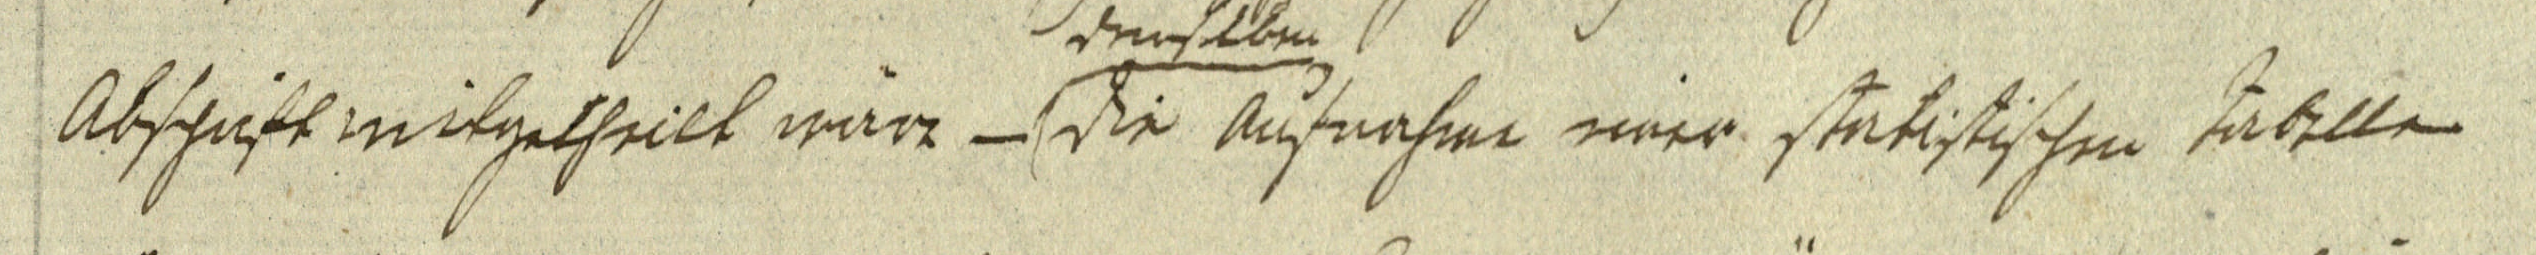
Abschrift mitgetheilt wäre - die Aufnahme einer statistischen Tabelle
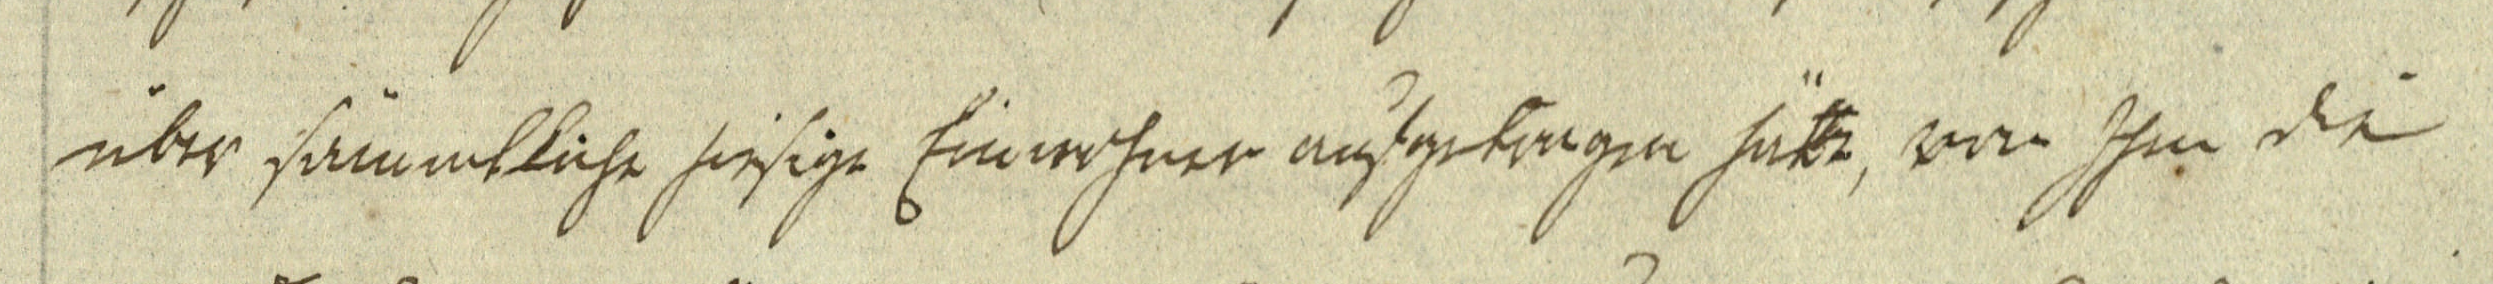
über sämmtliche hiesige Einwohner aufgetragen hätte, von Ihm die
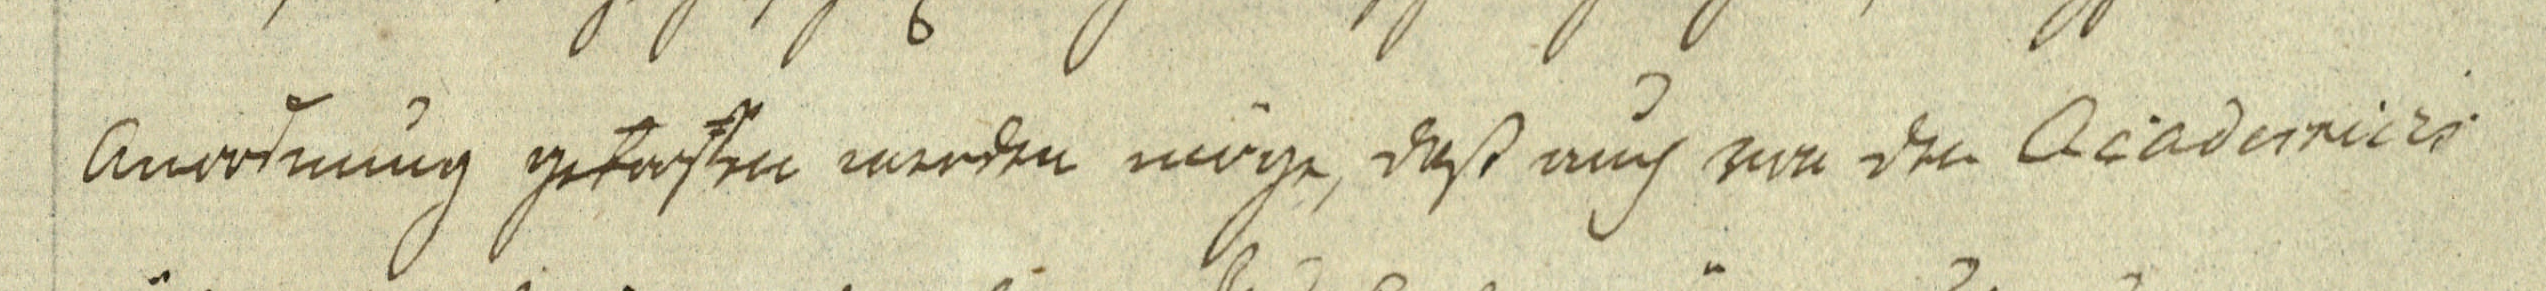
Anordnung getroffen werden möge, daß auch von den Academicis
